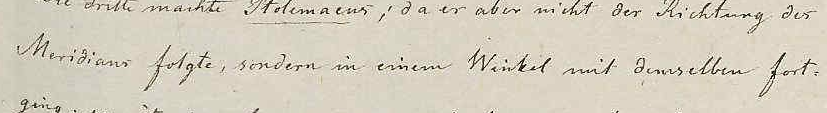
Meridians folgte, sondern in einem Winkel mit demselben fort-
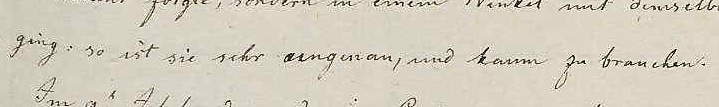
ging: so ist sie sehr ungenau, und kaum zu brauchen.
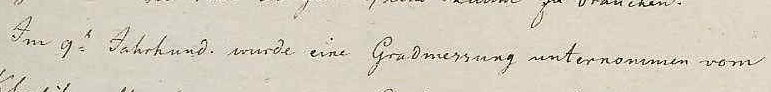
Im 9￼ Jahrhund. wurde eine Gradmessung unternommen vom
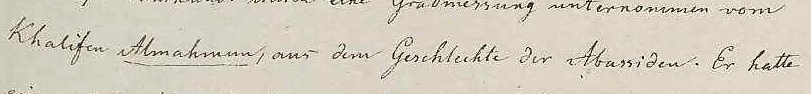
Khalifen Almahmun, aus dem Geschlechte der Abassiden. Er hatte
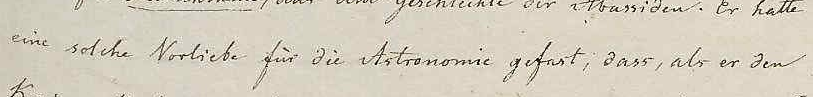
eine solche Vorliebe für die Astronomie gefast, dass, als er den
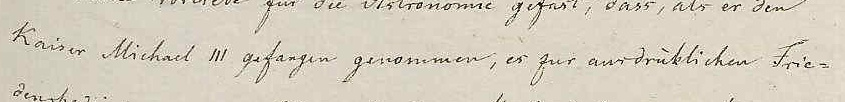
Kaiser Michael III gefangen genommen, es zur ausdrüklichen Frie-
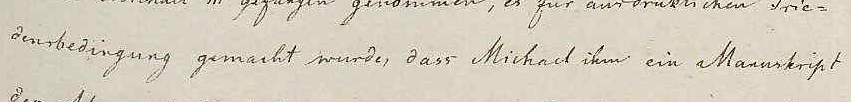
densbedingung gemacht wurde, dass Michael ihm ein Manuskript
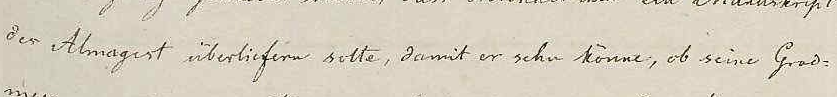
des Almagest überliefern solte, damit er sehn könne, ob seine Grad-
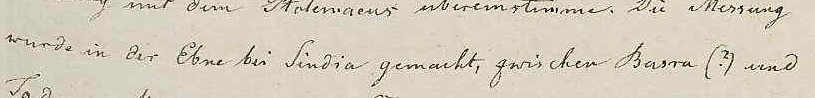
wurde in der Ebne bei Sindia gemacht, zwischen Basra und
